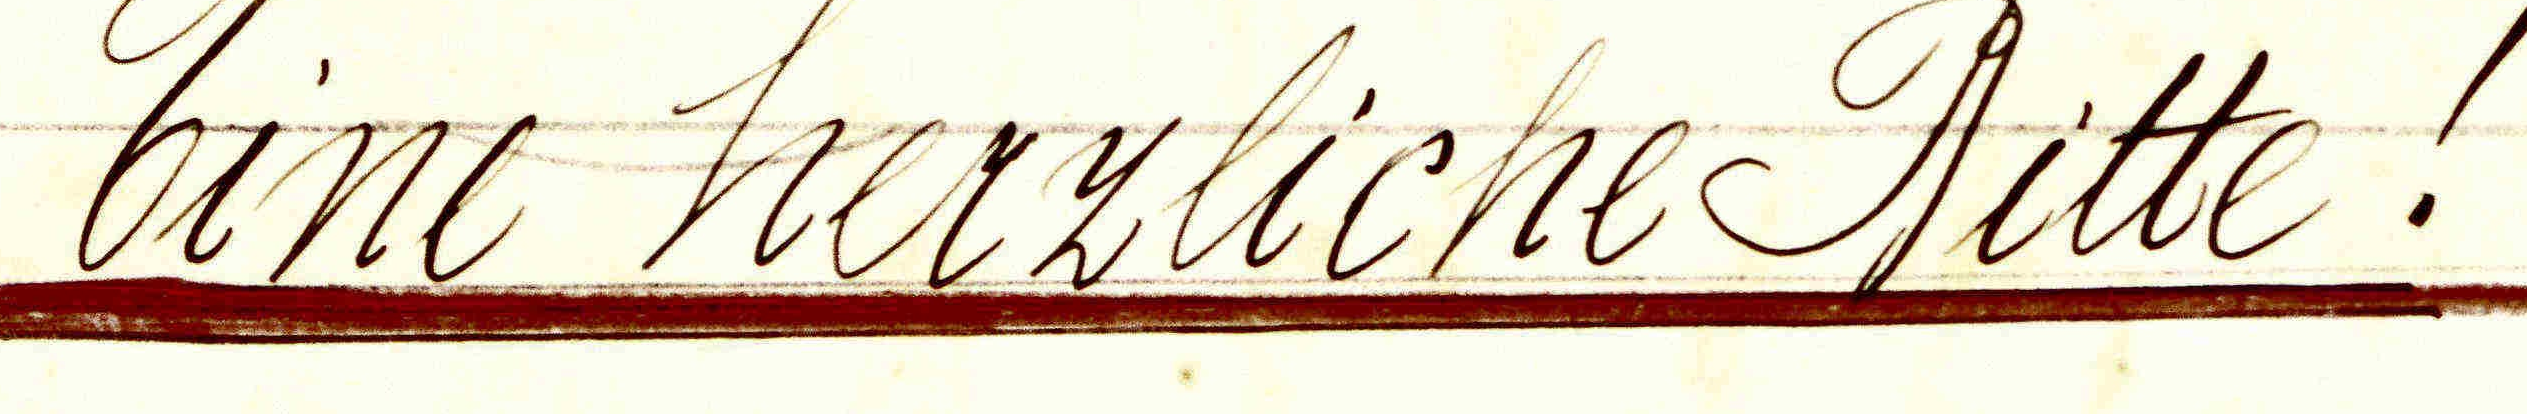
Eine herzliche Bitte!
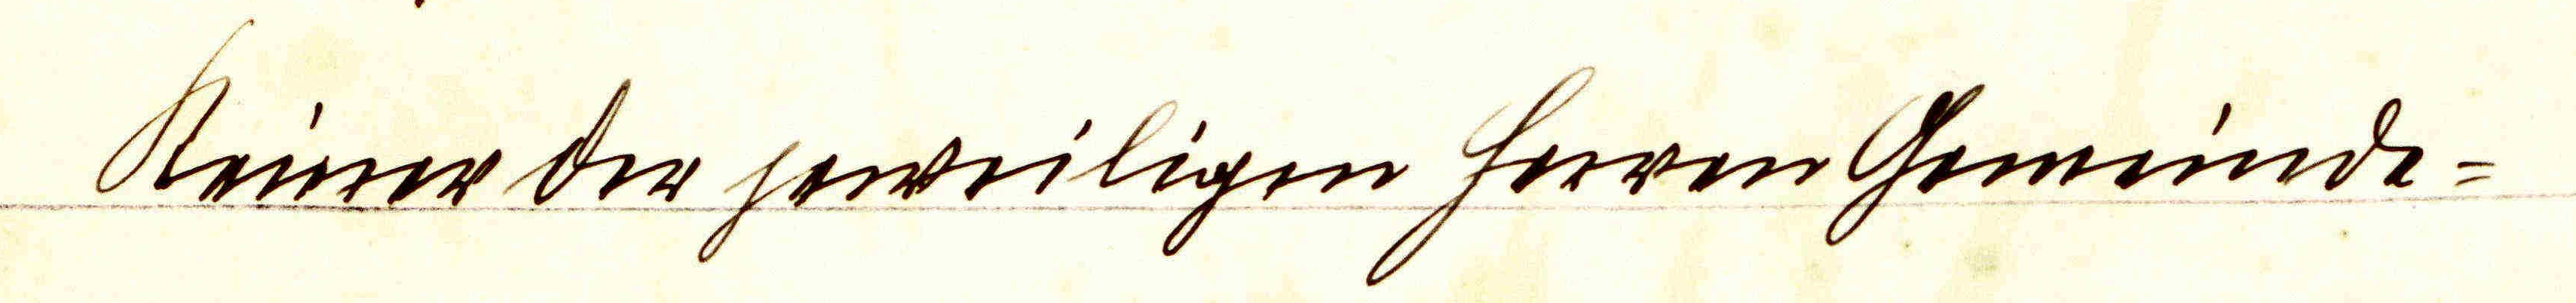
Keiner der jeweiligen Herren Gemeinde-
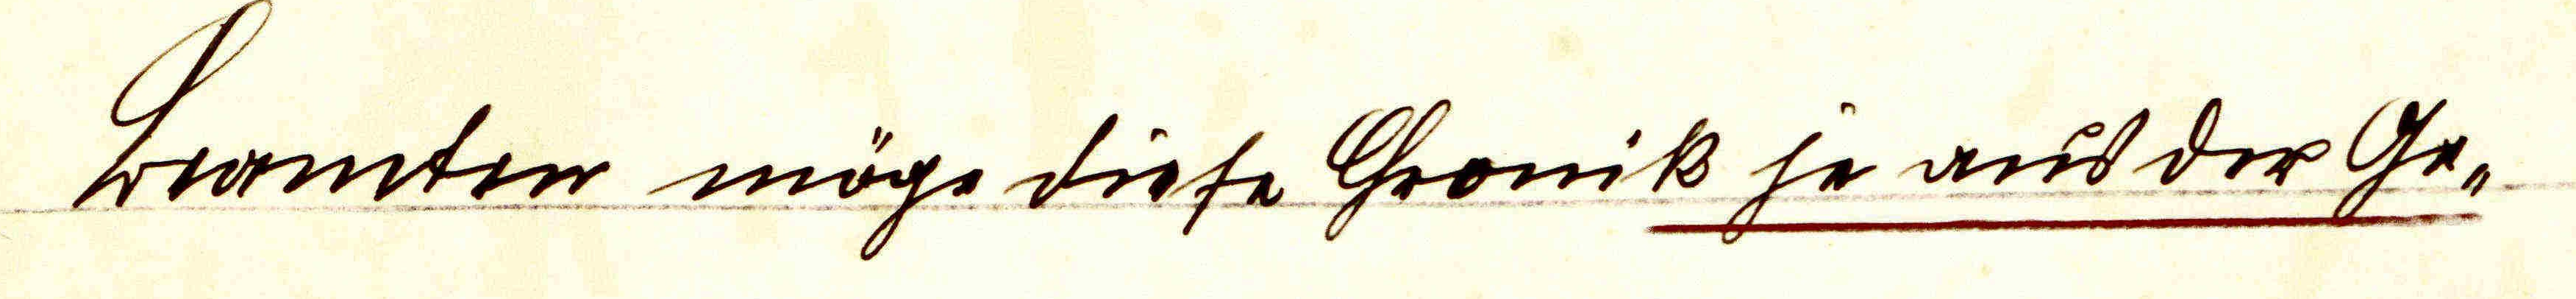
beamten möge diese Chronik je aus der Ge-
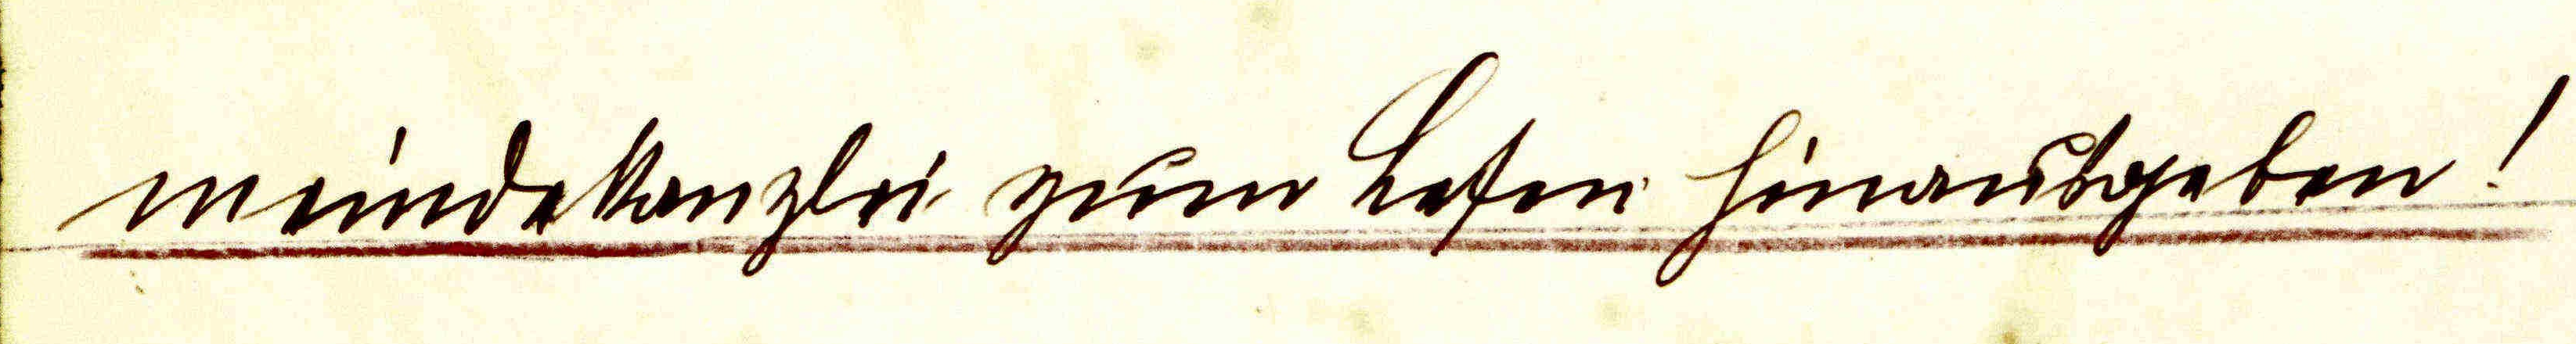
meindekanzlei zum Lesen herausgeben!
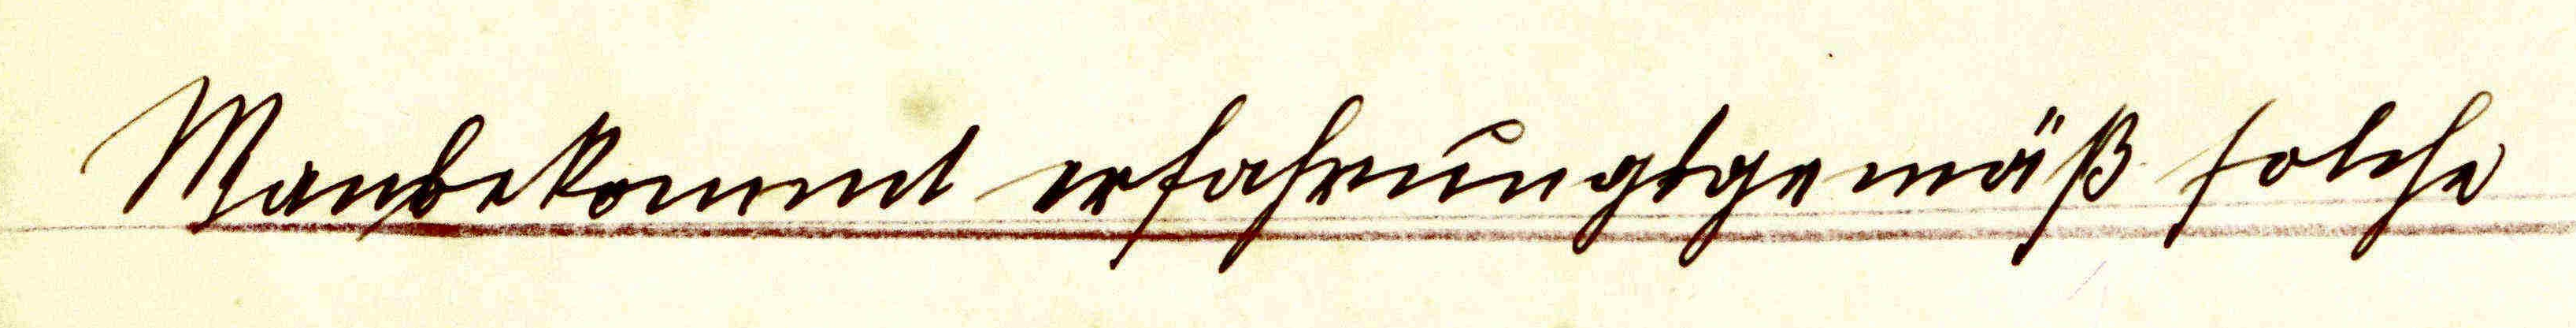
Man bekommt erfahrungsgemäß solche
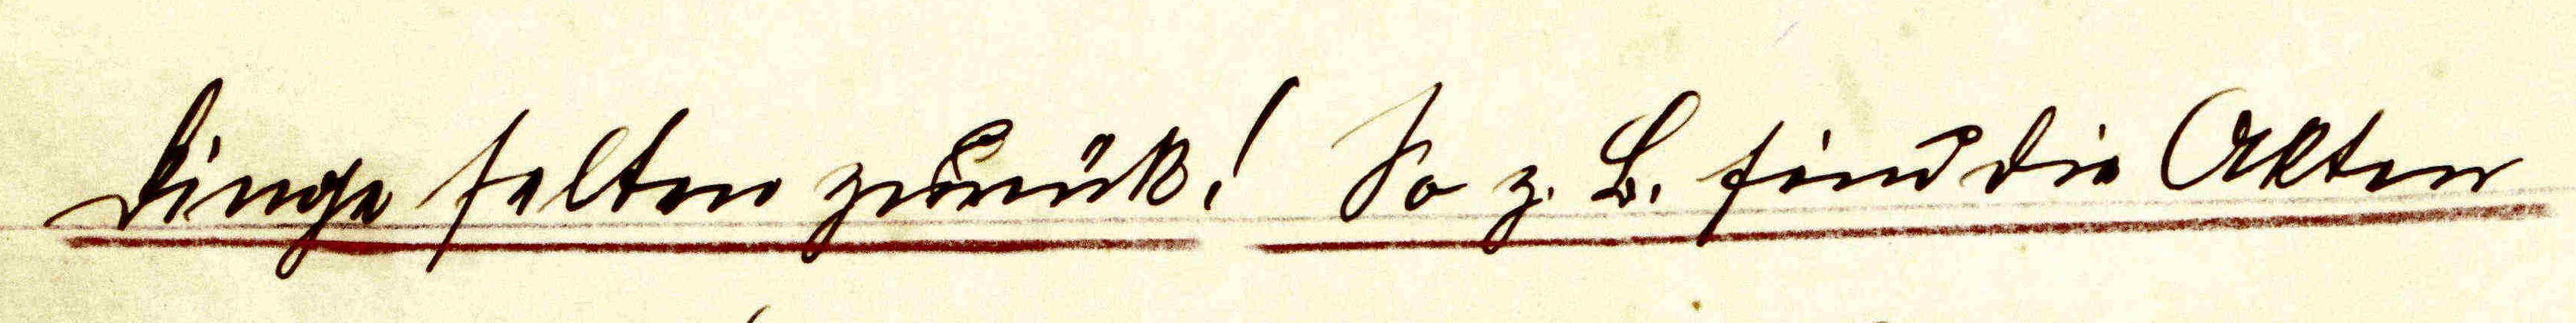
Dinge selten zurück! So z.B. sind die Akten
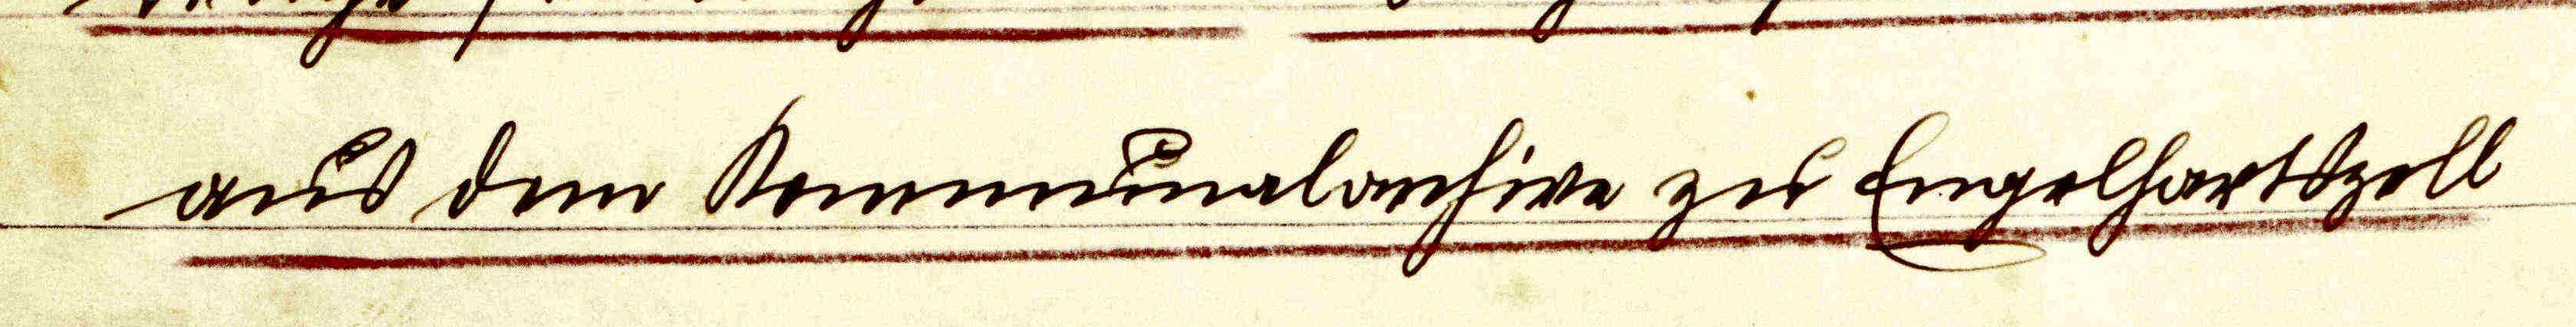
aus dem Kommunalarchiv zu Engelhartszell
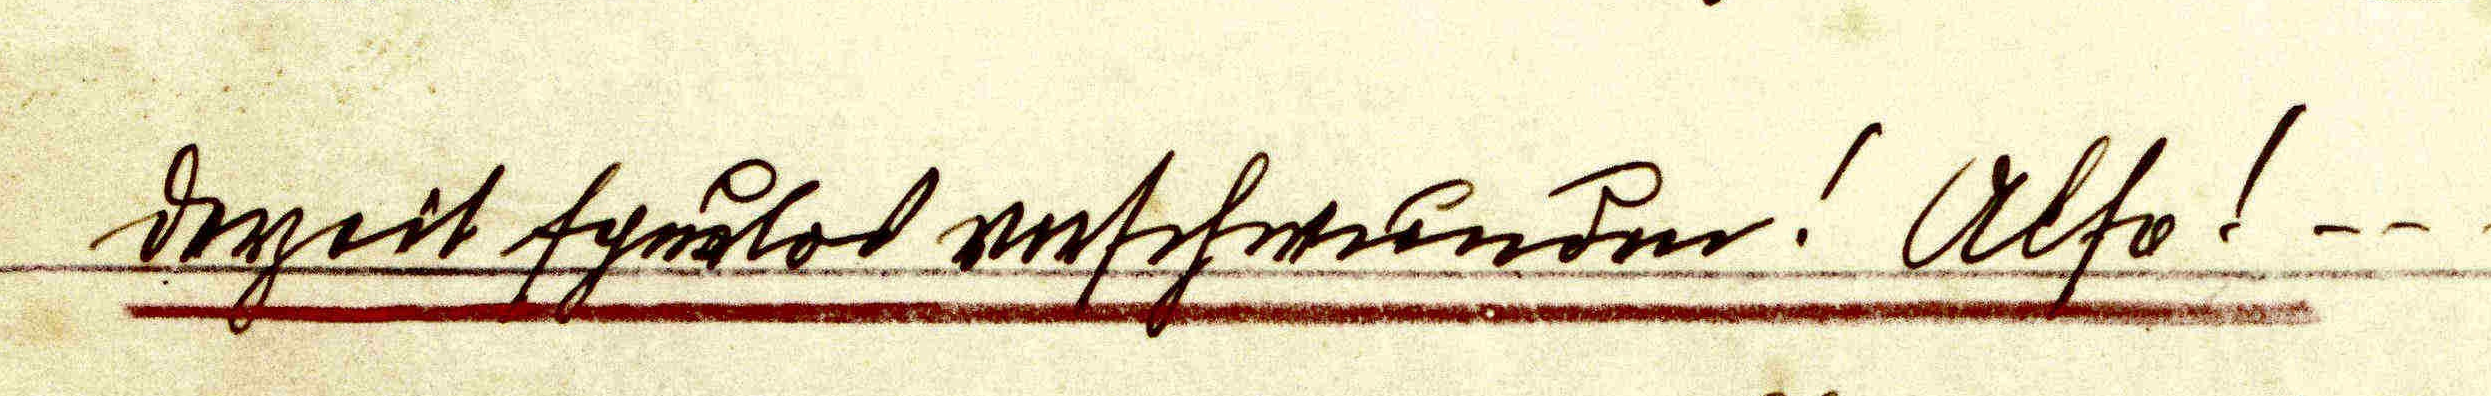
derzeit spurlos verschwunden! Also! ….
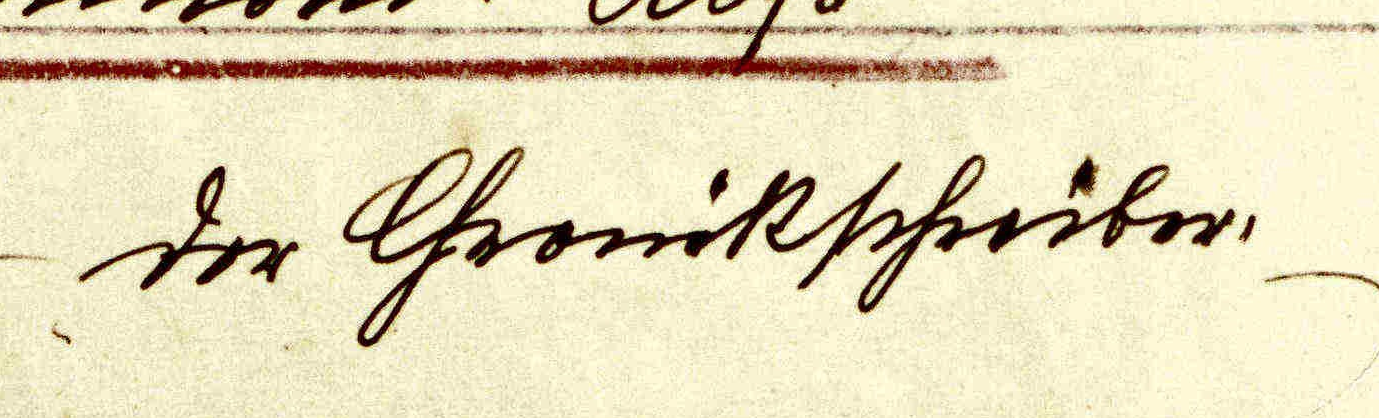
der Chronikschreiber
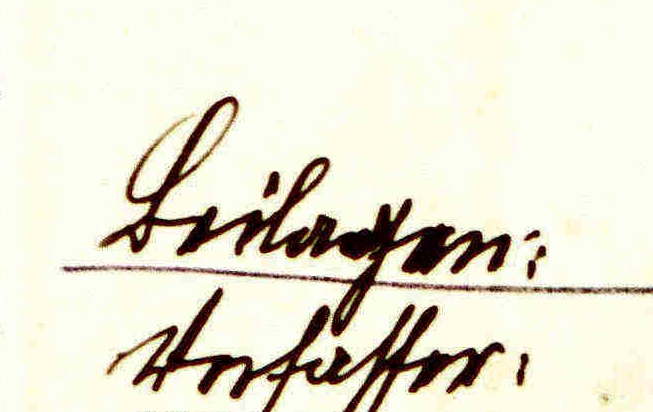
Beilagen:
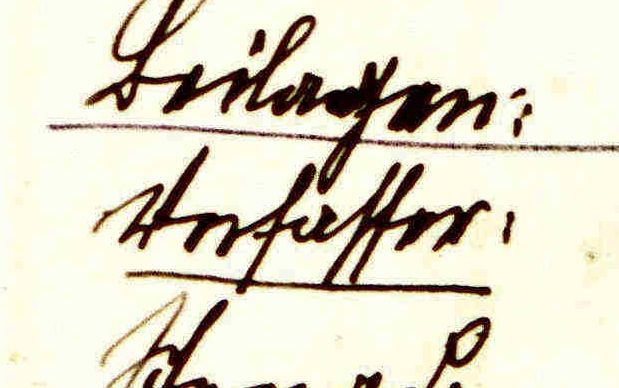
Verfasser:
